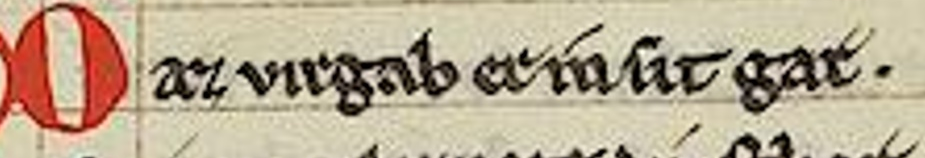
Daz virgab er in ſit gar.
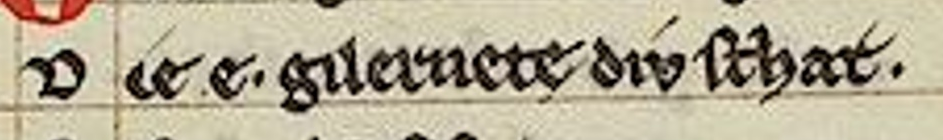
Die e. gilernete div ſchar.
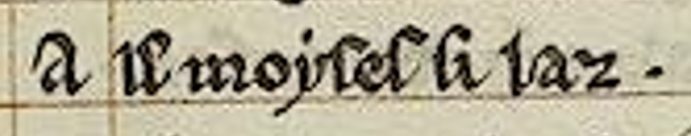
Alſ moyſeſ ſi laz.
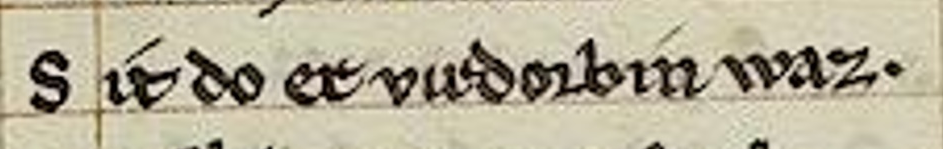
Sit do er virdorbin waz.
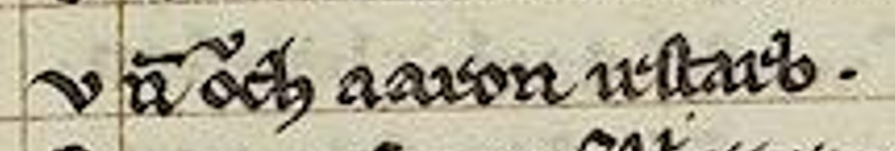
Vn(d) o°vch aaron irſtarb.
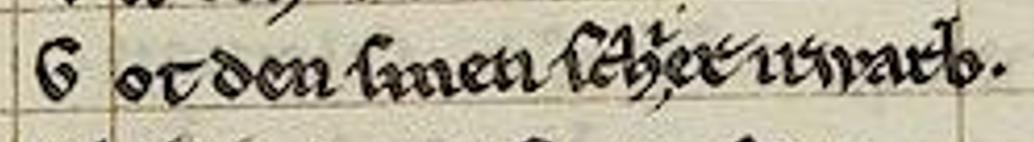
Got den ſinen ſch°(i)er irwarb.
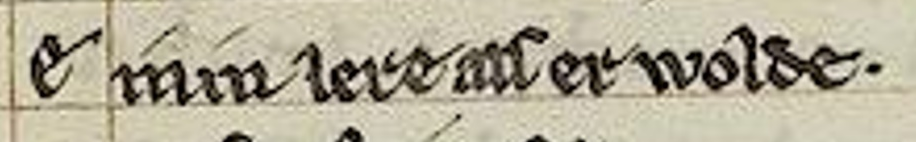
Einin lere alſ er wolde.
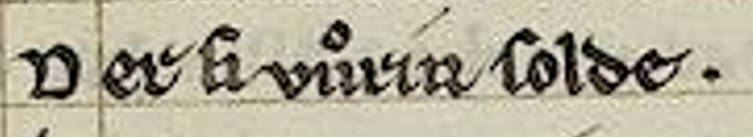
Der ſi vu°orin ſolde.
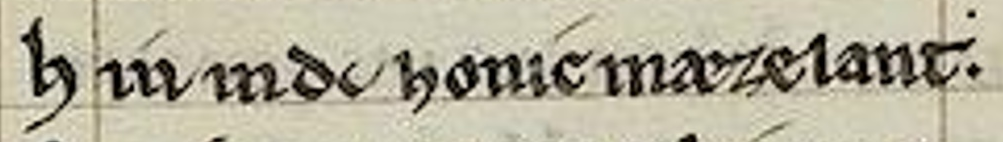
Hin in d(az) honic m[ae]ze lant.
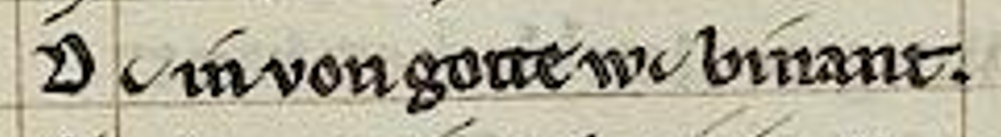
D(az) in von gotte w(az) binant.
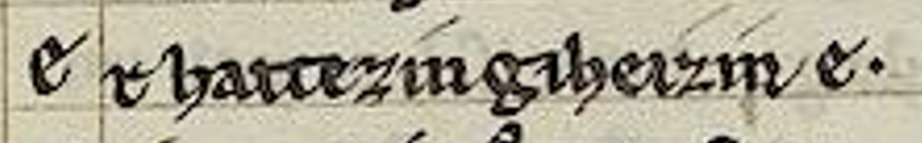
Er hattez in giheizin e.
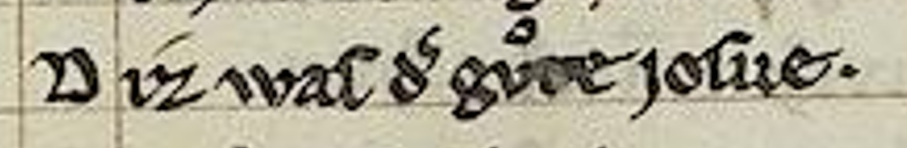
Diz waſ d(er) gv°ote joſue.
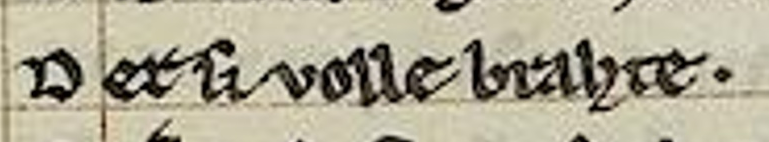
Der ſi volle brahte.
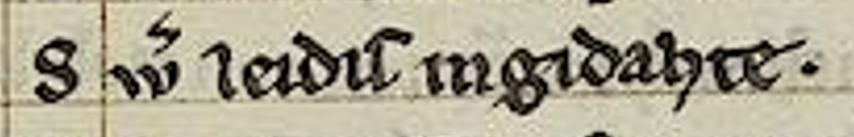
Sw(er) leidiſ in gidahte.
